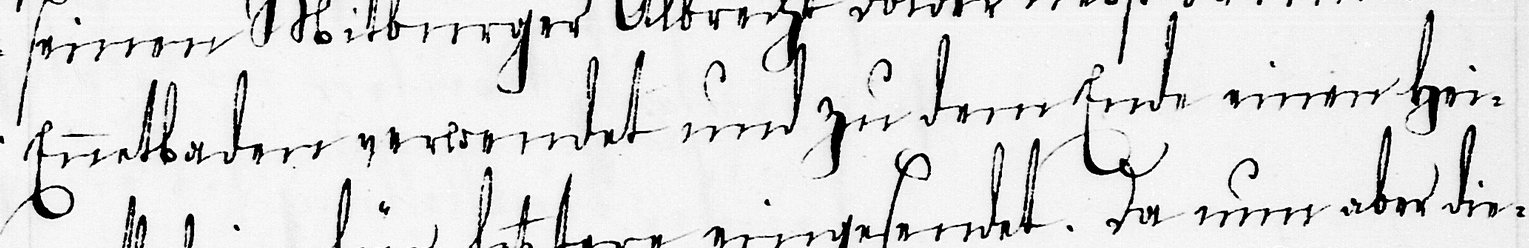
Ennetbaden verwendet und zu dem Ende einen Hei¬
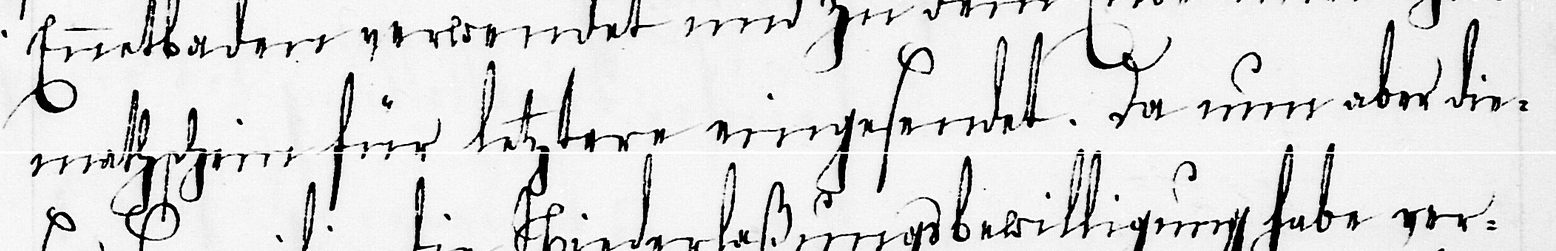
mathschein für letztere eingesendet. Da nun aber die¬
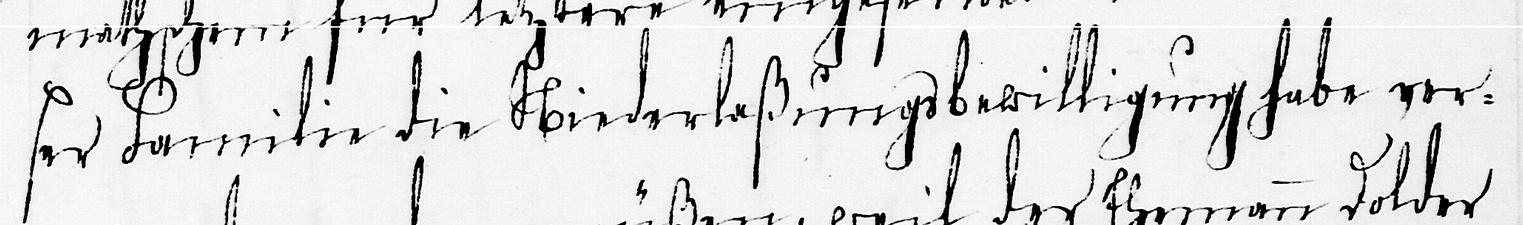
ser Familie die Niederlaßungsbewilligung habe ver¬
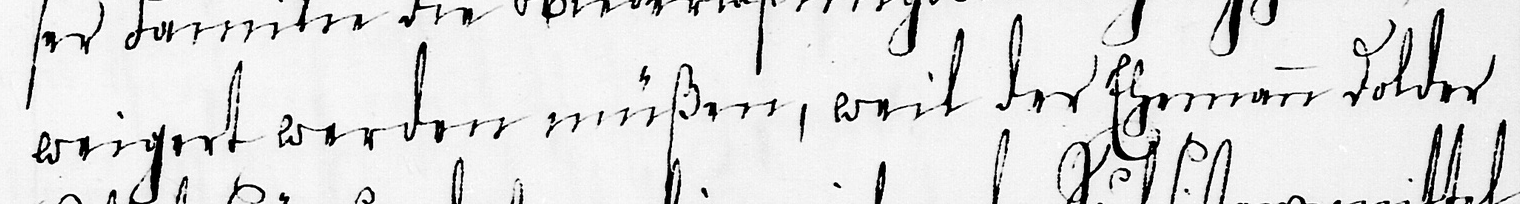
weigert werden müßen, weil der Ehemann Dolder
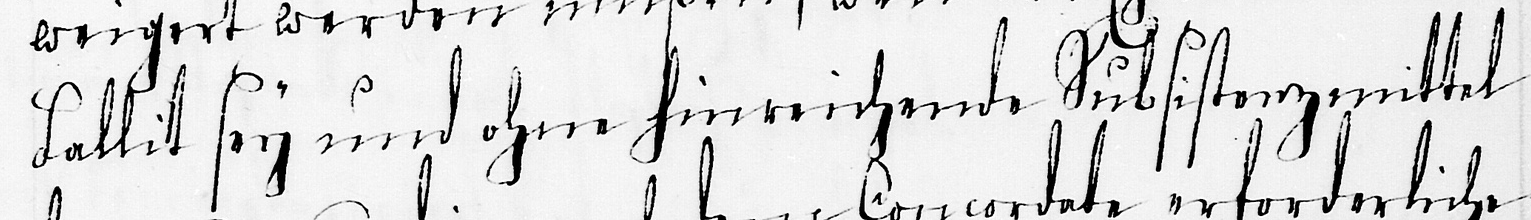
Fallit sey und ohne hinreichende Subsistenzmittel
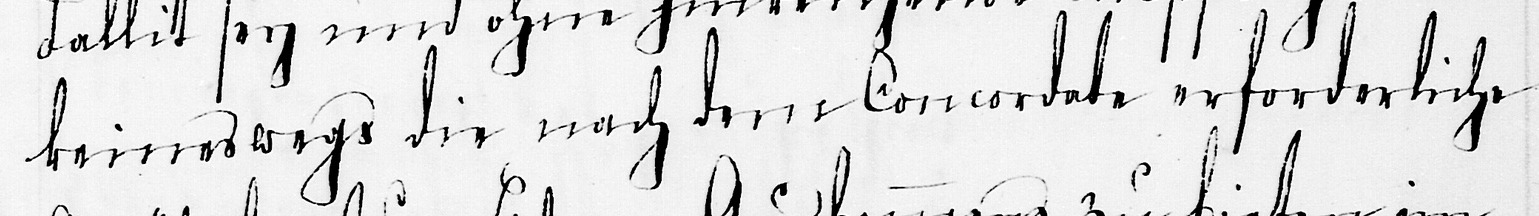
keineswegs die nach dem Concordate erforderliche
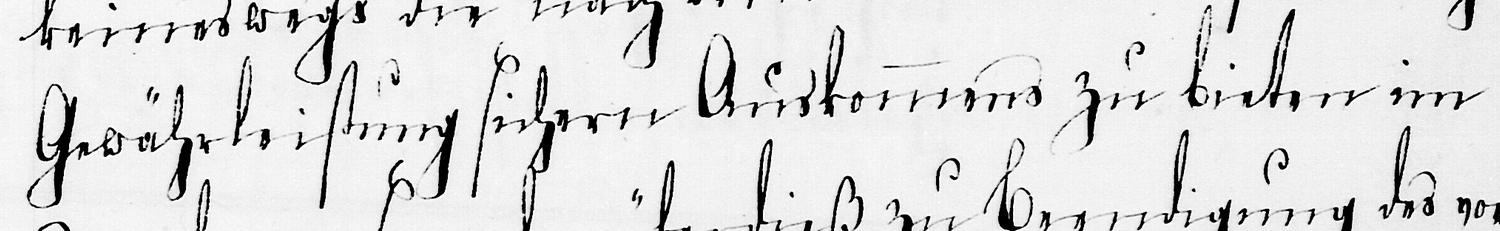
Gewährleistung sichern Auskommens zu bieten im
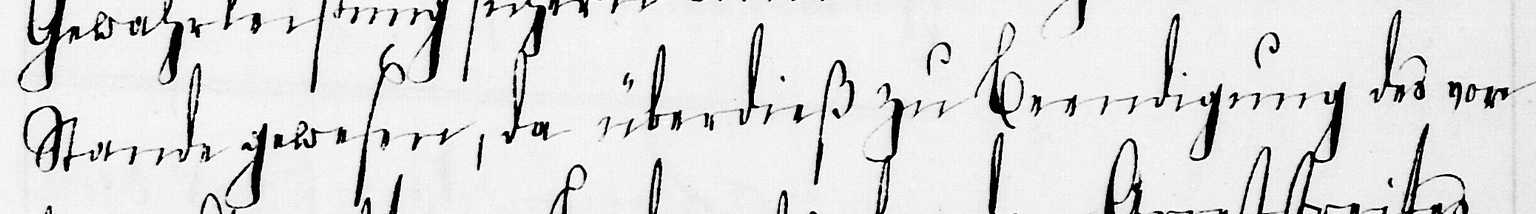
Stande gewesen, da überdieß zu Beendigung des vor
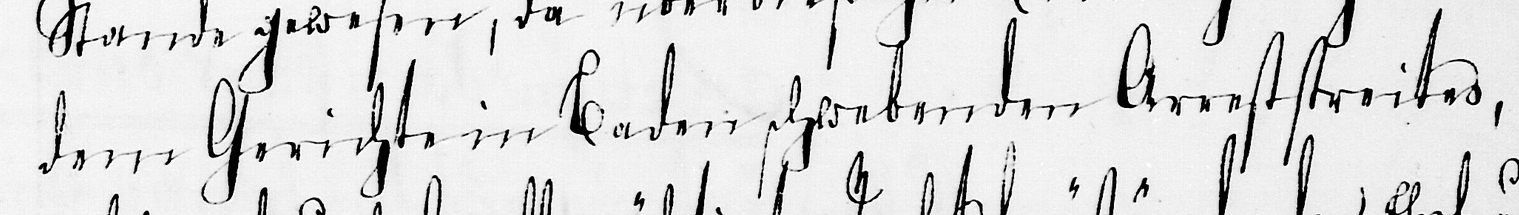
dem Gerichte in Baden schwebenden Arreststreites,
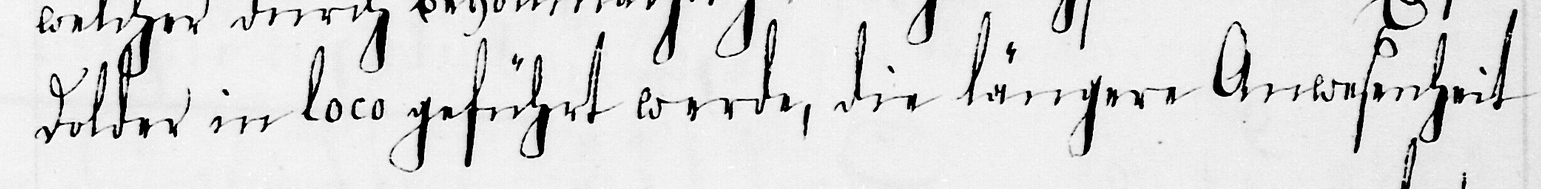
Dolder in loco geführt werde, die längere Anwesenheit
